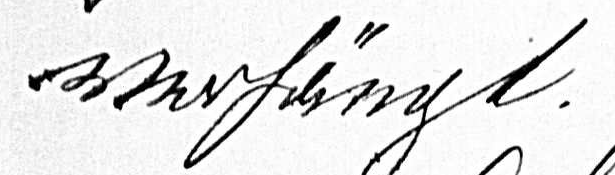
verhängt.
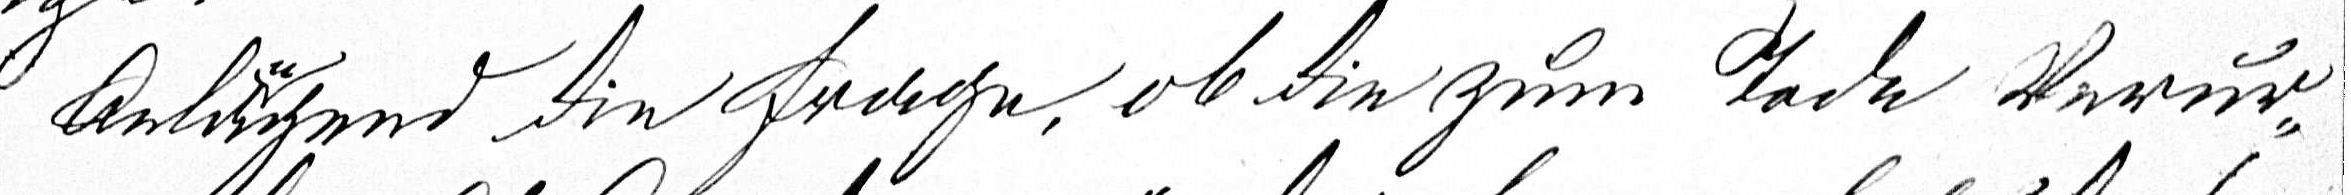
Anlangend die Frage, ob die zum Tode Verur¬
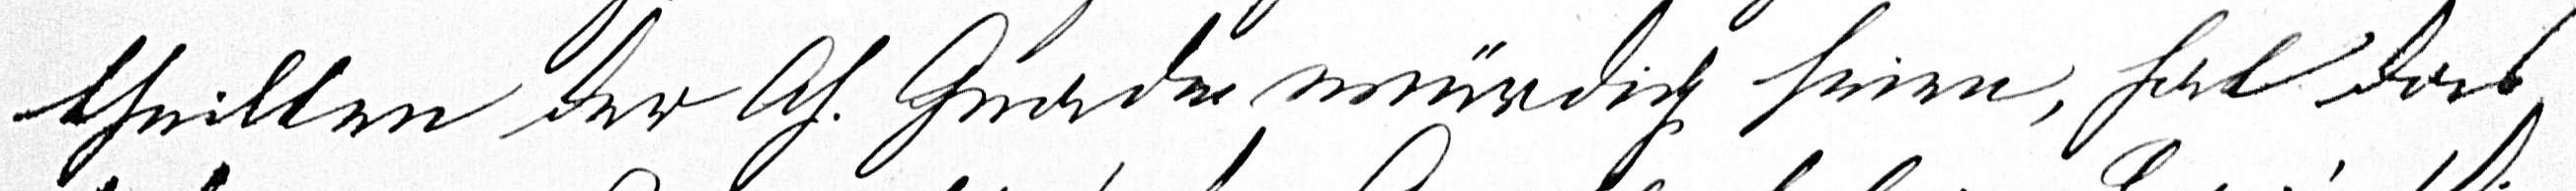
theilten der Ah. Gnade würdig seien, hat das
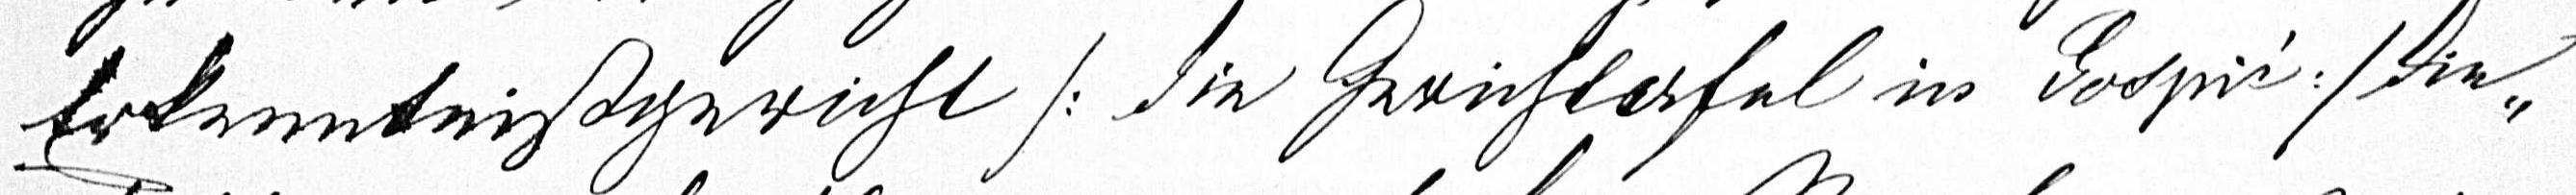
Erkenntnißgericht /: die Gerichtafel in Gospić :/ die¬
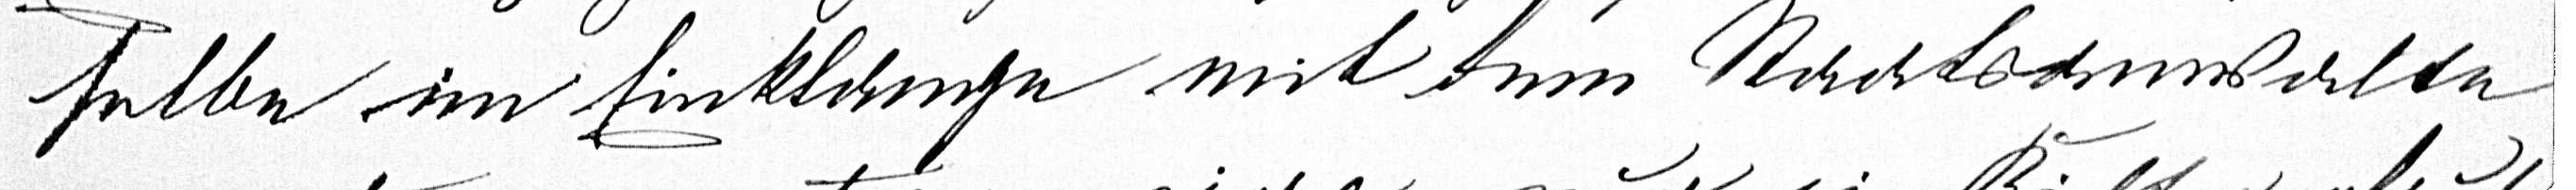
selbe im Einklange mit dem Staatsanwalte
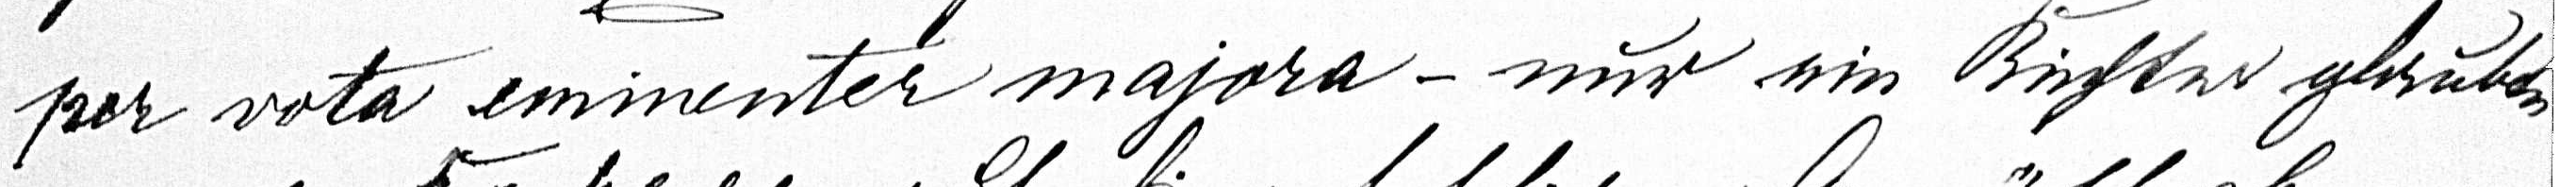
per vota eminenter majora - nur ein Richter glauben
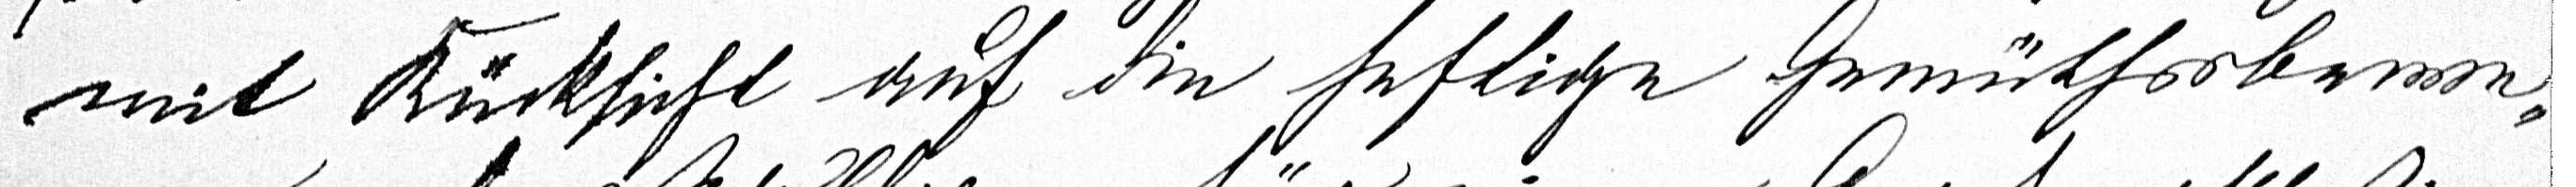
mit Rücksicht auf die heftige Gemüthsbewe¬
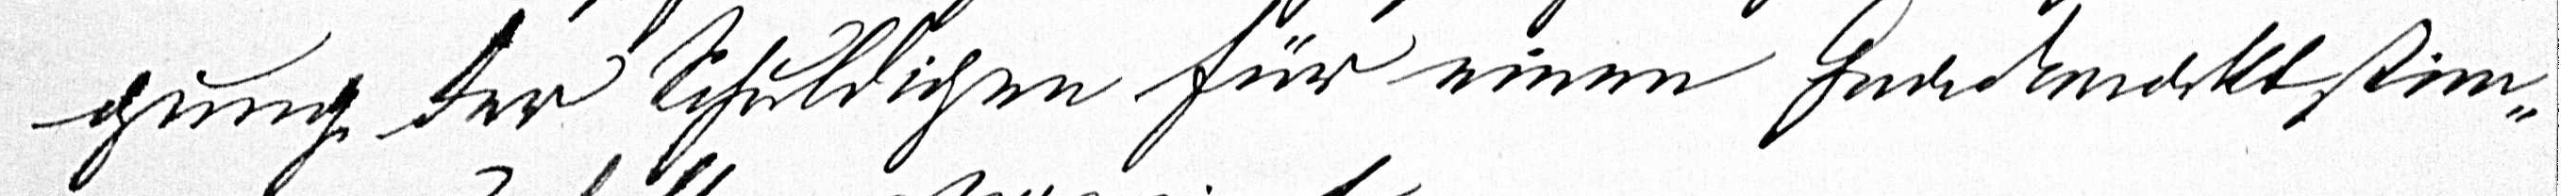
gung der Schuldigen für einen Gnadenakt stim¬
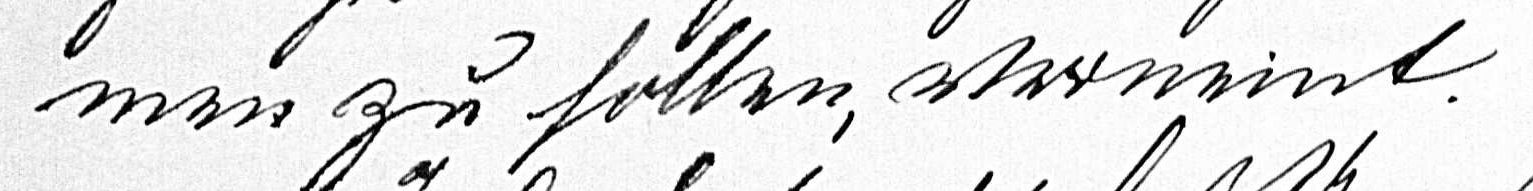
men zu sollen, verneint.
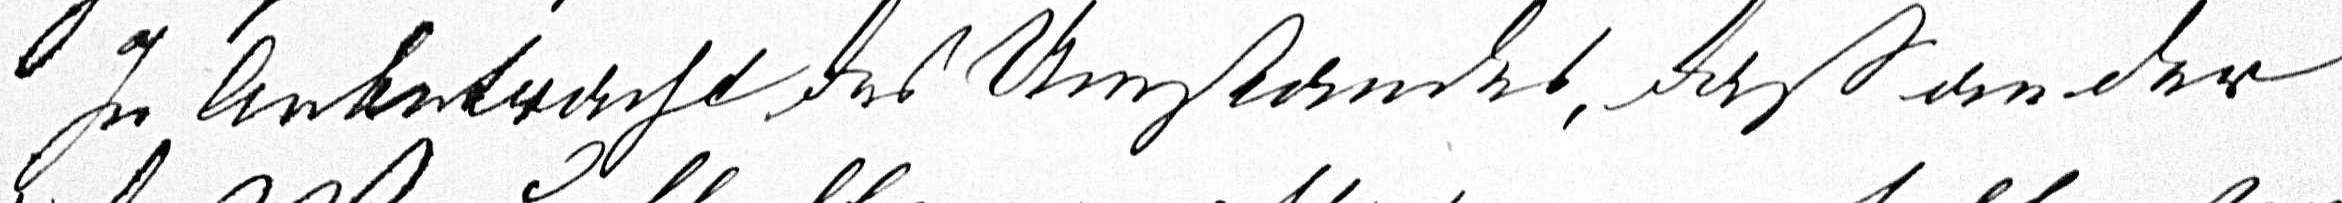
Jn Anketracht des Umstandes, daß an der
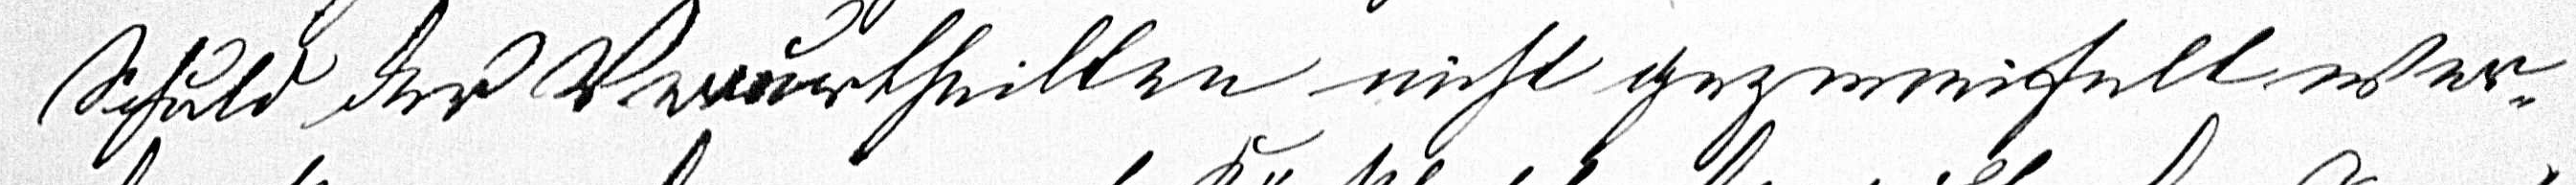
Schuld der Verurtheilten nicht gezweifelt wer¬
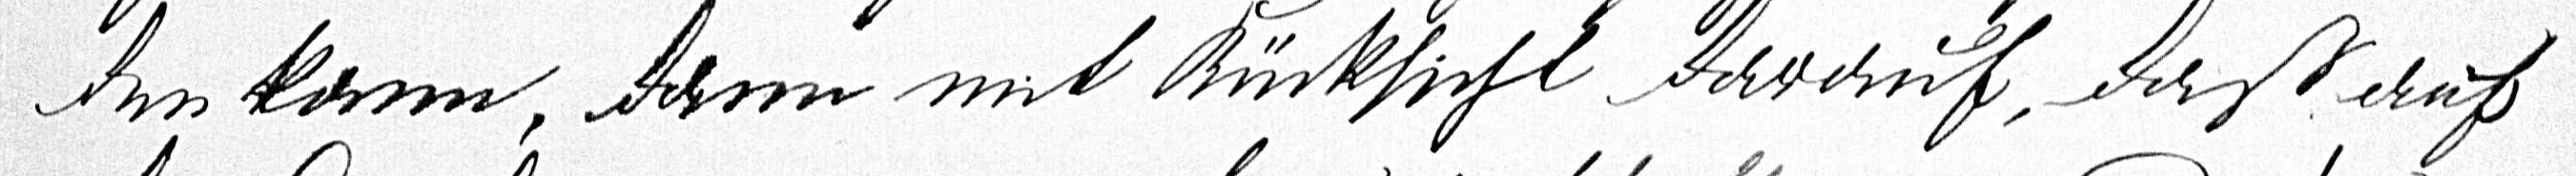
den kann, dann mit Rücksicht darauf, daß auf
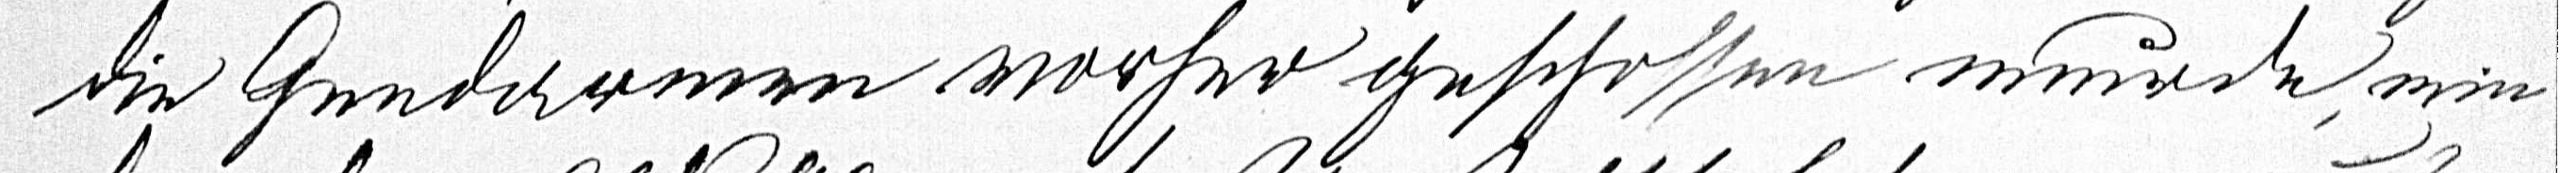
die Gendarmen vorher geschlossen wurde, xx
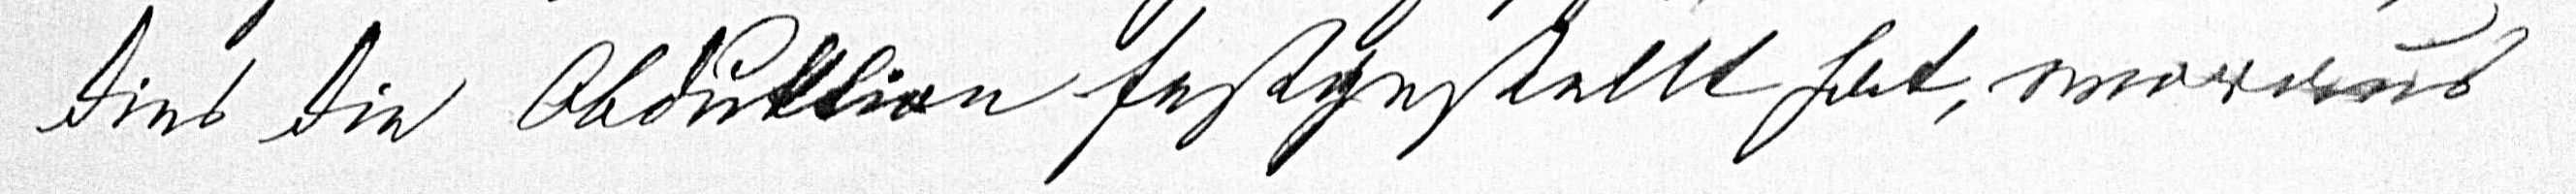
dies die Obduktion festgestellt hat, woraus
